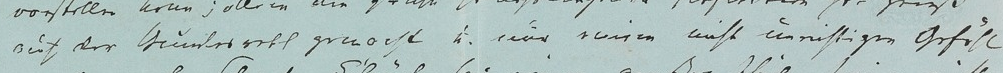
auch der Bundesrath gemacht u. nur einem nicht unrichtigen Gefühl
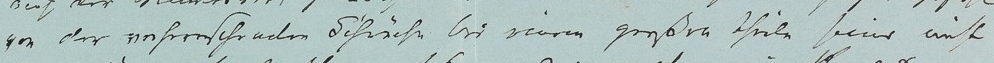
von der vorherrschenden Schwäche bei einem großen Theile seiner nicht
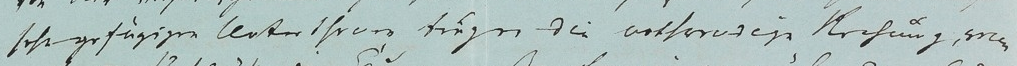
sehr gefügigen Unterthanen trugen die nothwendige Rechnung, wenn
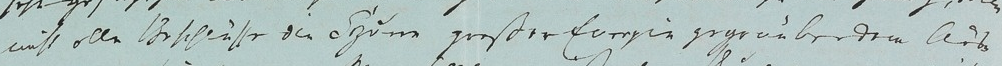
nicht alle Beschlüsse die Spuren großer Energie gegenüber dem Aus-
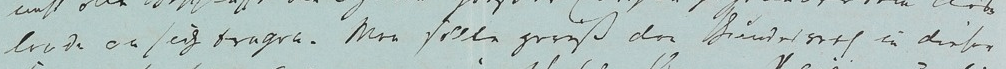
lande an sich tragen. Man sollte gewiß den Bundesrath in dieser
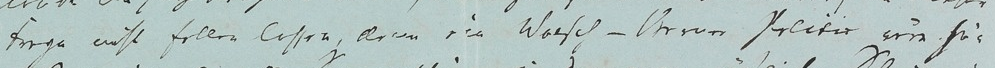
Frage nicht fallen lassen, denn die Welsch-Berner Politic wäre si-
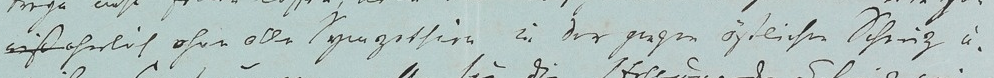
riß cherlich ohne alle Sympathie in der ganzen östlichen Schweiz u.
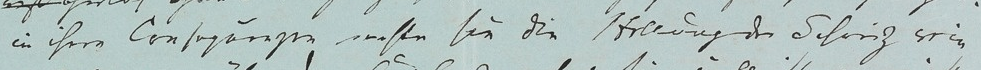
in ihren Consequenzen machte sie die Stellung der Schweiz rein
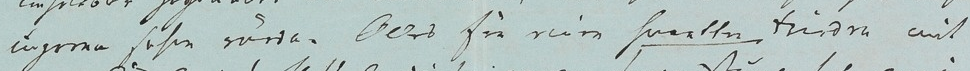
ungerne sehen würde. Alles für einen honetten Frieden mit
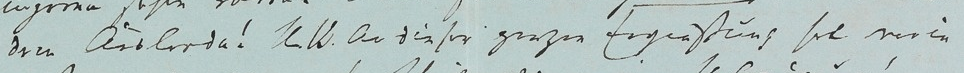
dem Auslande! N. B. An dieser ganzen Ergießung hat mein
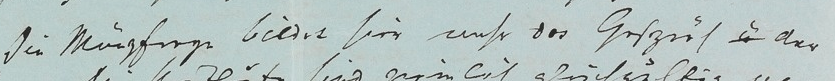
Die Münzfrage bildet hier mehr das Gespräch u der
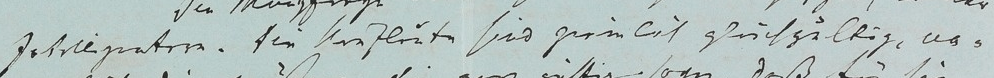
Intelligentern. Die Kaufleute sind ziemlich gleichgültig, na-
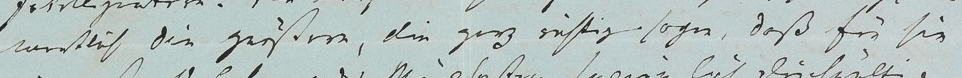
mentlich die größern, die ganz richtig sagen, daß für sie
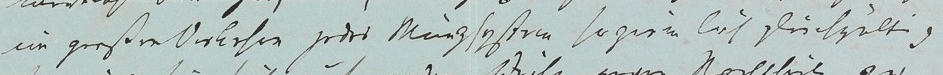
im großen Verkehre jedes Münzsystem so ziemlich gleichgültig
